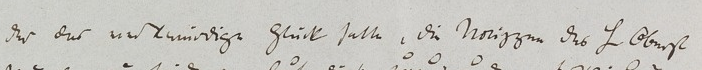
der das merkwürdige Glück hatte, die Notizzen des H. Oberst
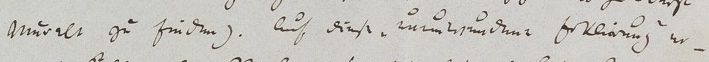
Muralt zu finden). Auf diese «unumwundene Erklärung» er-
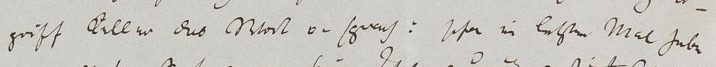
griffKeller das Wort &. sprach: Schon im letzten Mal habe
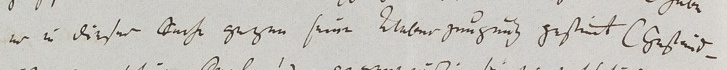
er in dieser Sache gegen seine Ueberzeugung gestimmt (Geständ-
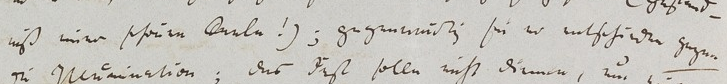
niß einer schönen Seele!); gegenwärtig sei er entschieden gegen
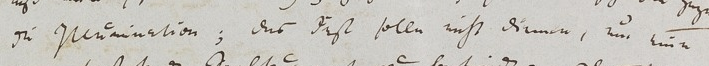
die Illumination; das Fest solle nicht dienen, um eine
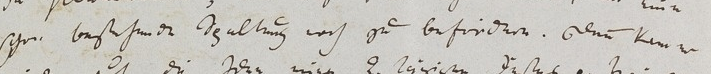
schon bestehende Spaltung noch zu befördern. Dann kam er
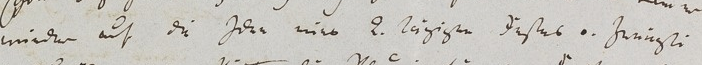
wieder auf die Idee eines 2. tägigen Festes &.Zwingli
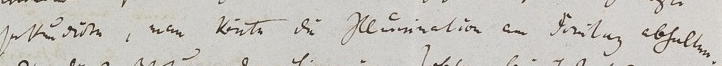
sekundirte, man könnte die Illumination am Freitag abhalten. –
